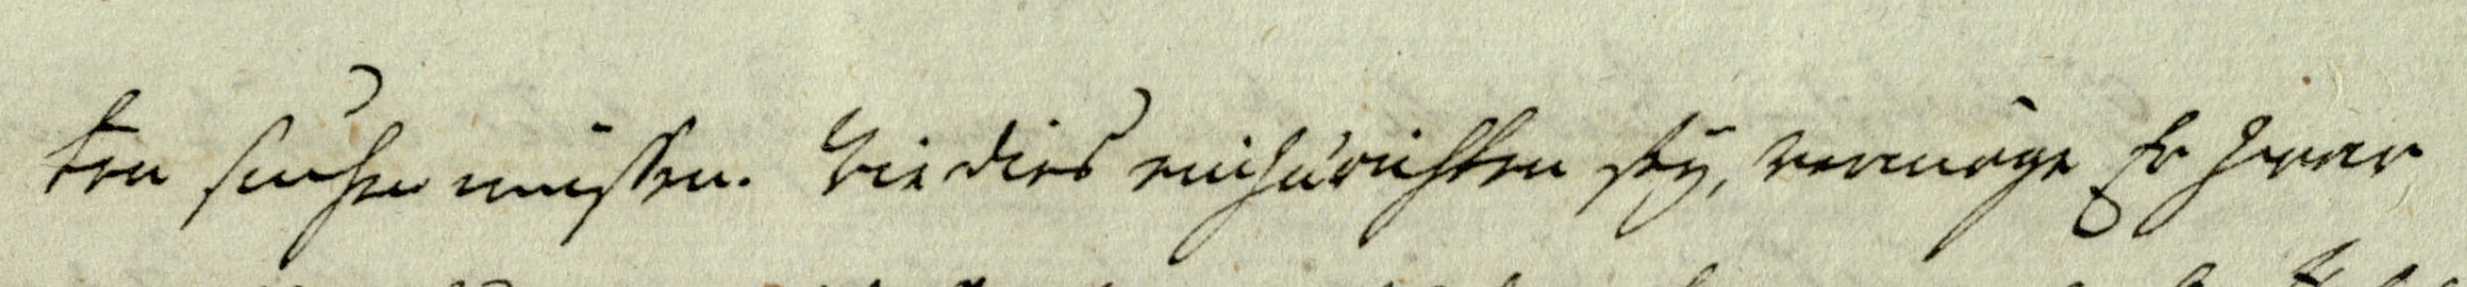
ten suchen müssen. Wie dies einzurichten seÿ, vermöge Er zwar
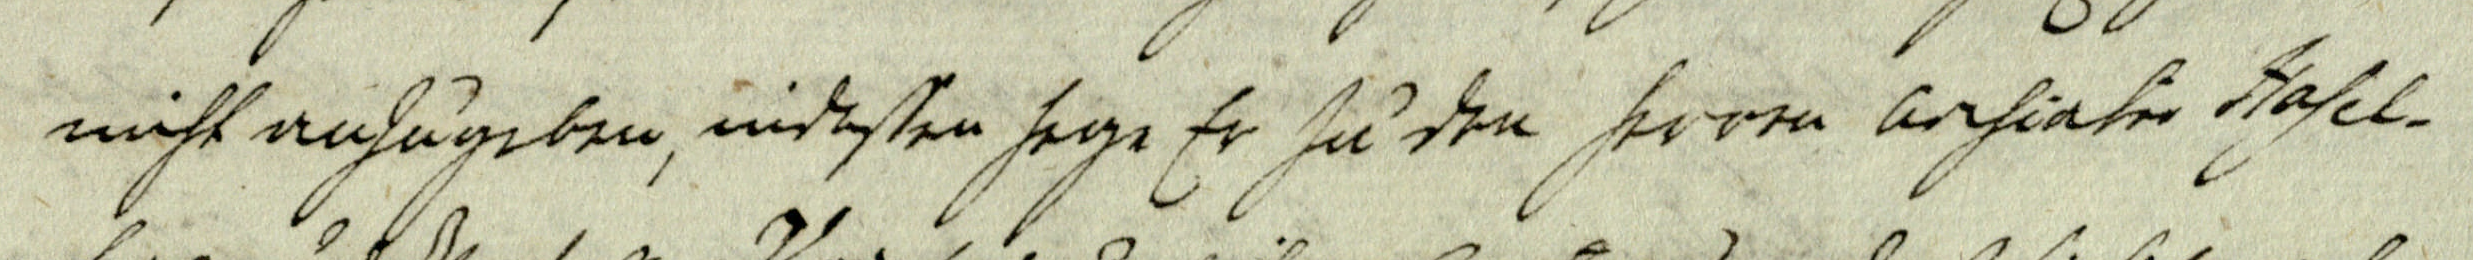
nicht anzugeben, indessen hege Er zu den Herren Archiater Hasel¬
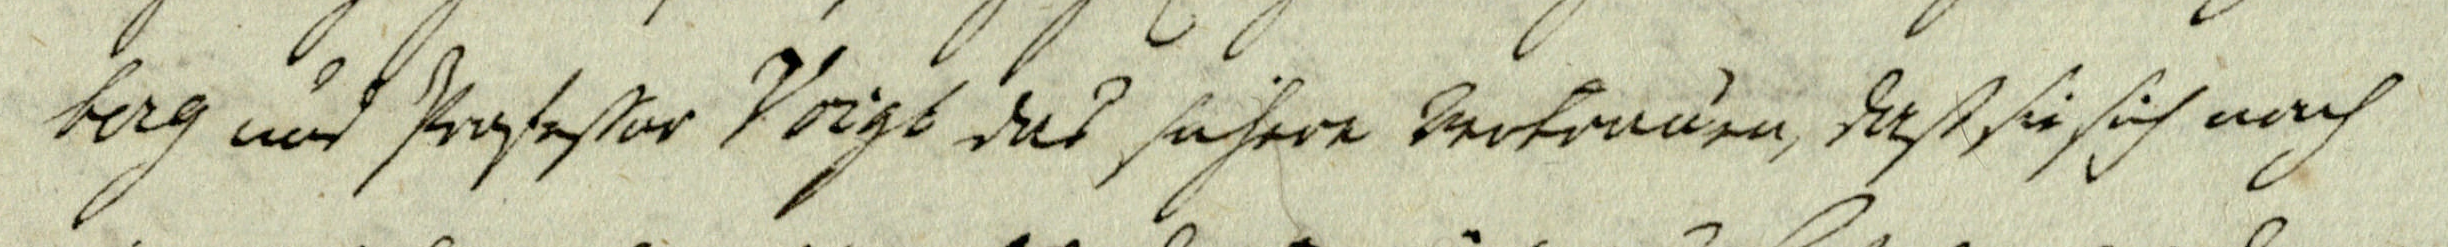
berg und Professor Voigt das sichere Vertrauen, daß sisich nach
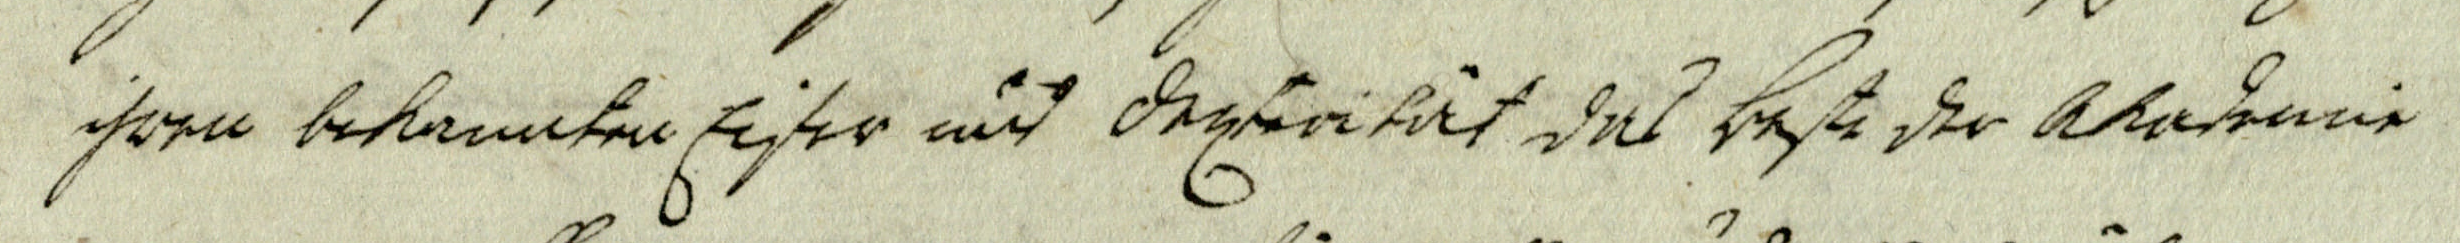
ihren bekannten Eifer und Dexterität das Beste der Akademie
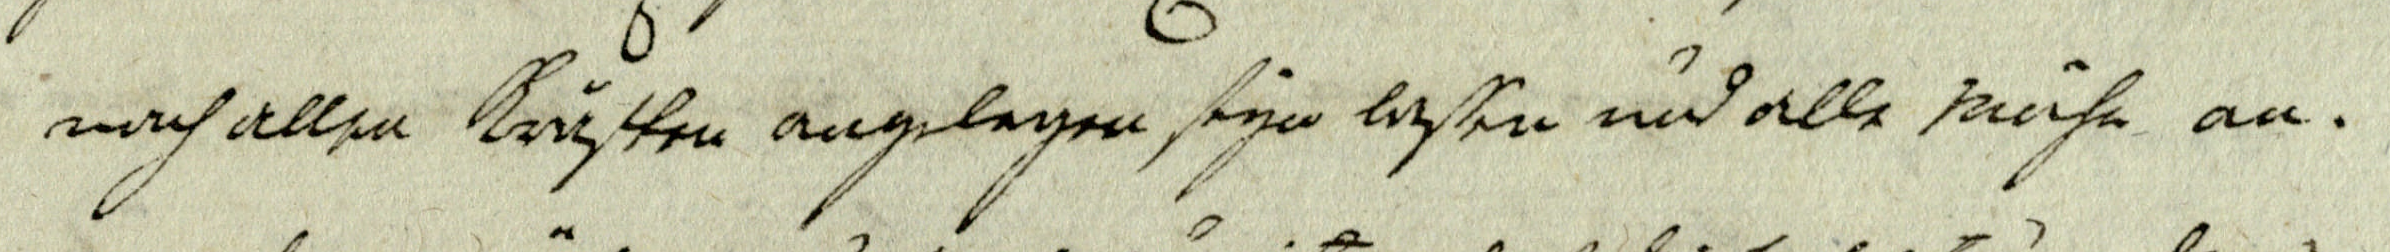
nach allen Kräften angelegen seÿn lassen und alle Mühe an¬
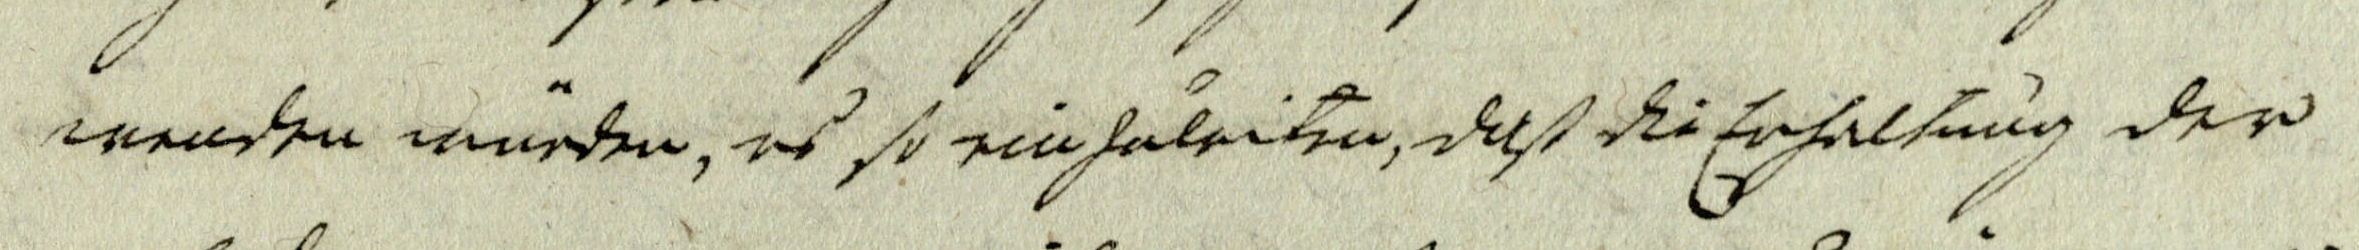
wenden würden, es so einzuleiten, daß die Erhaltung der
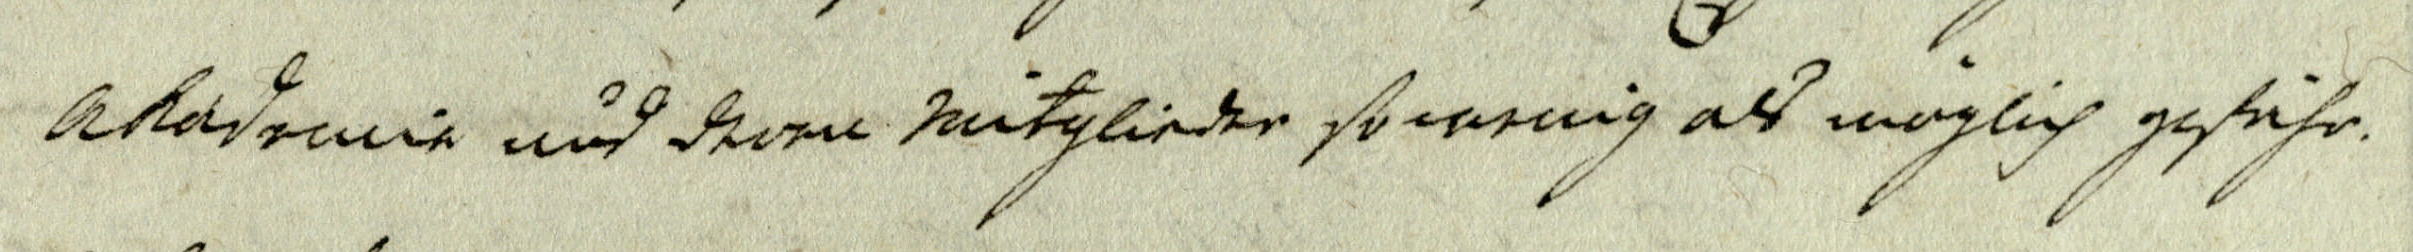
Akademie und deren Mitglieder so wenig als möglich gefähr¬
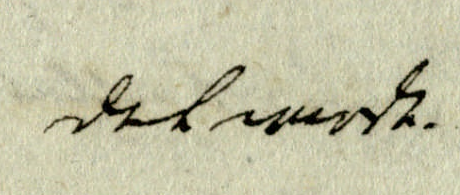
det werde.
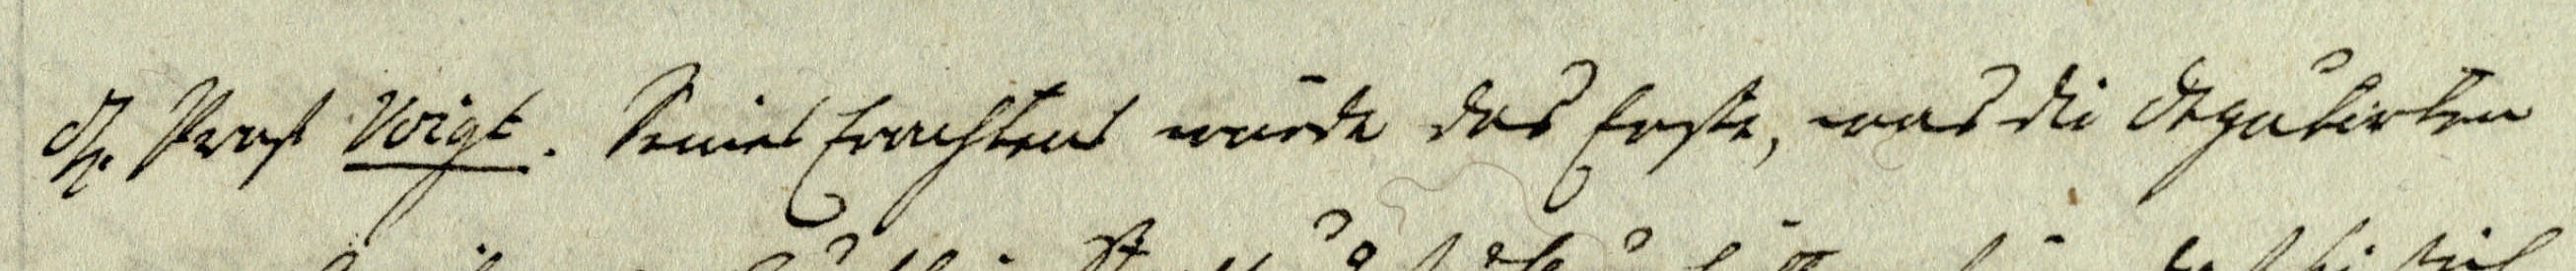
dh. Prof. Voigt. Seines Erachtens würde das Erste, was die Deputirten
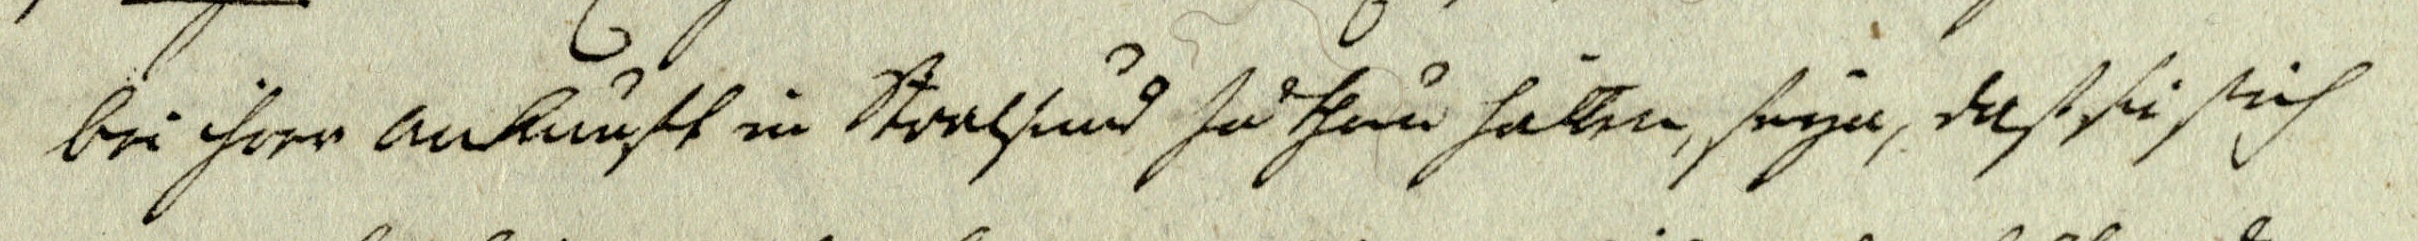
bei ihrer Ankunft in Stralsund zu thun hätten, seÿn, daß sie sich
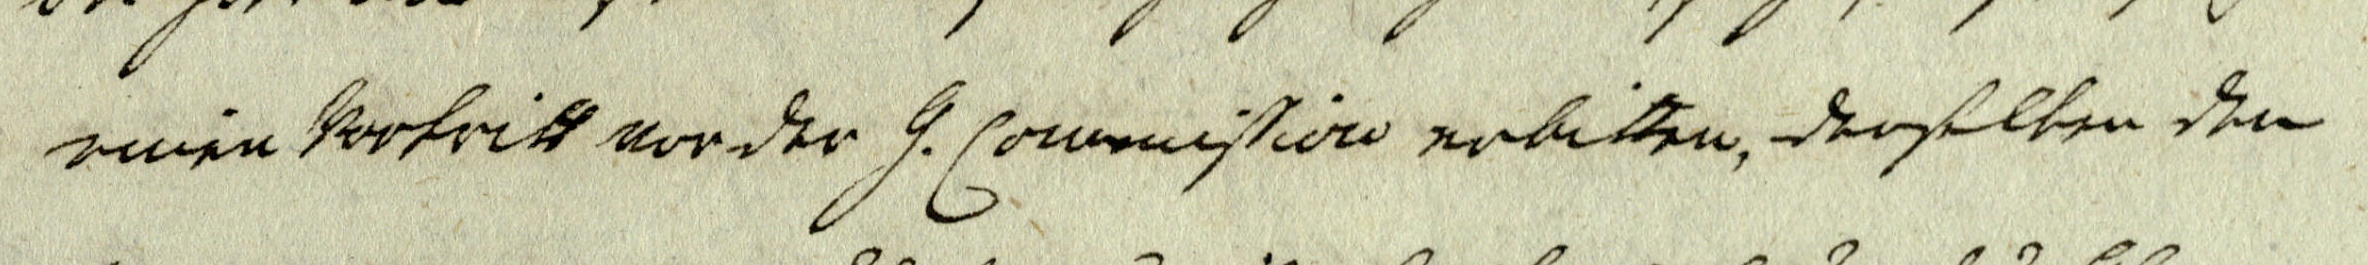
einen Vortritt vor der G. Commission erbitten, derselben den
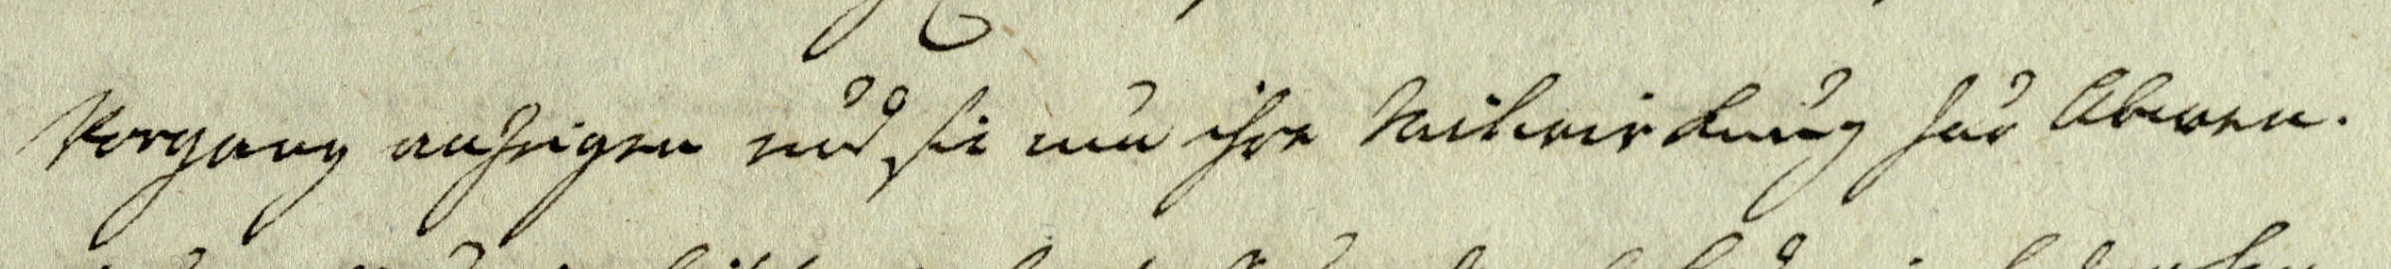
Vorgang anzeigen und sie um ihre Mitwirkung zur Abwen¬
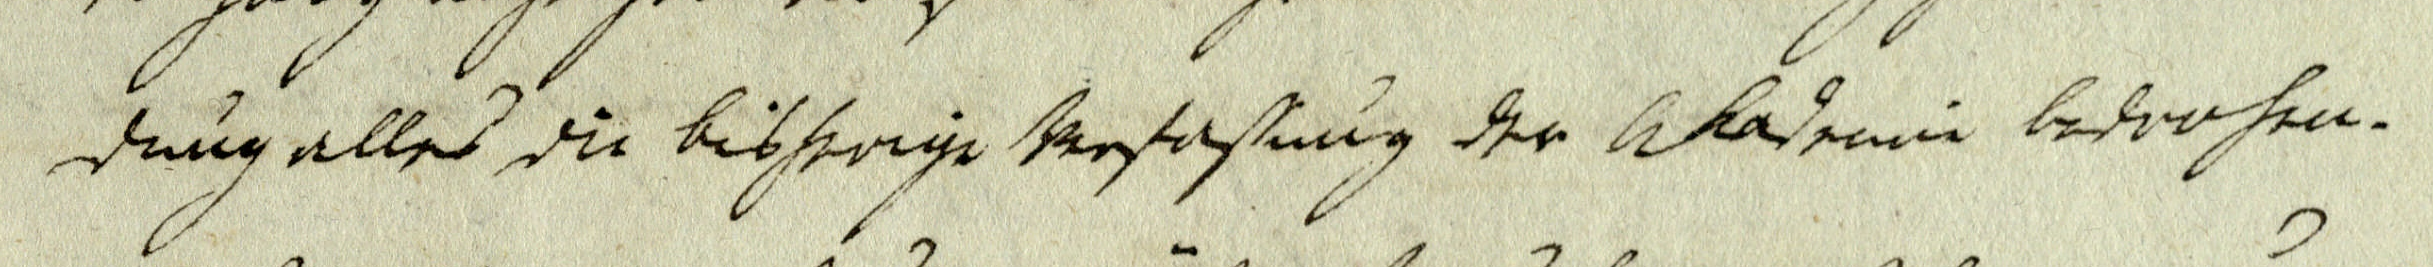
dung alles die bisherige Verfassung der Akademie bedrohen¬
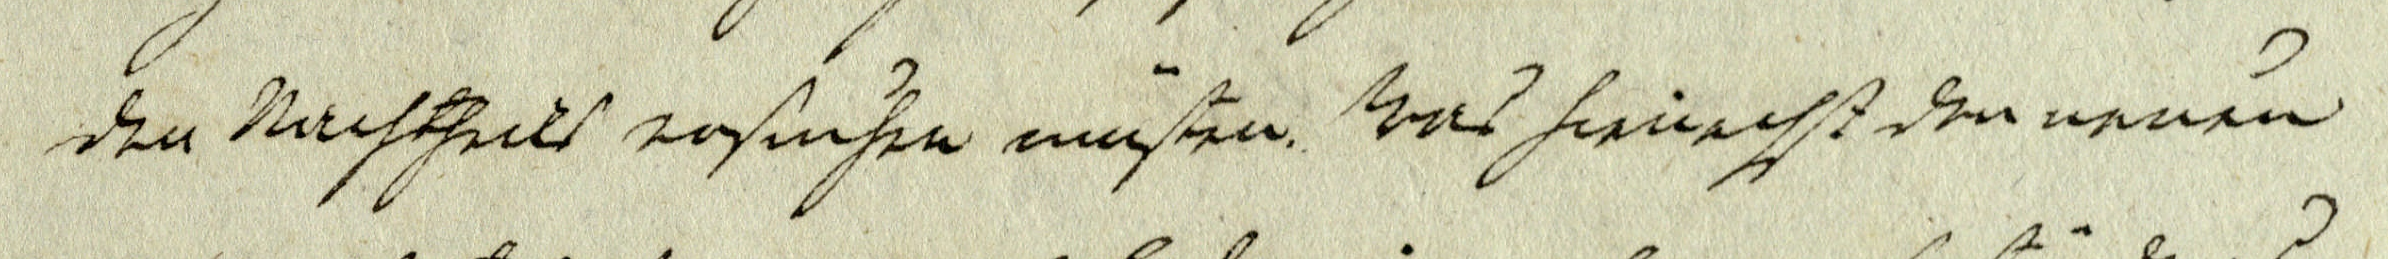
den Nachtheils ersuchen müsten. Was hienechst den neuen
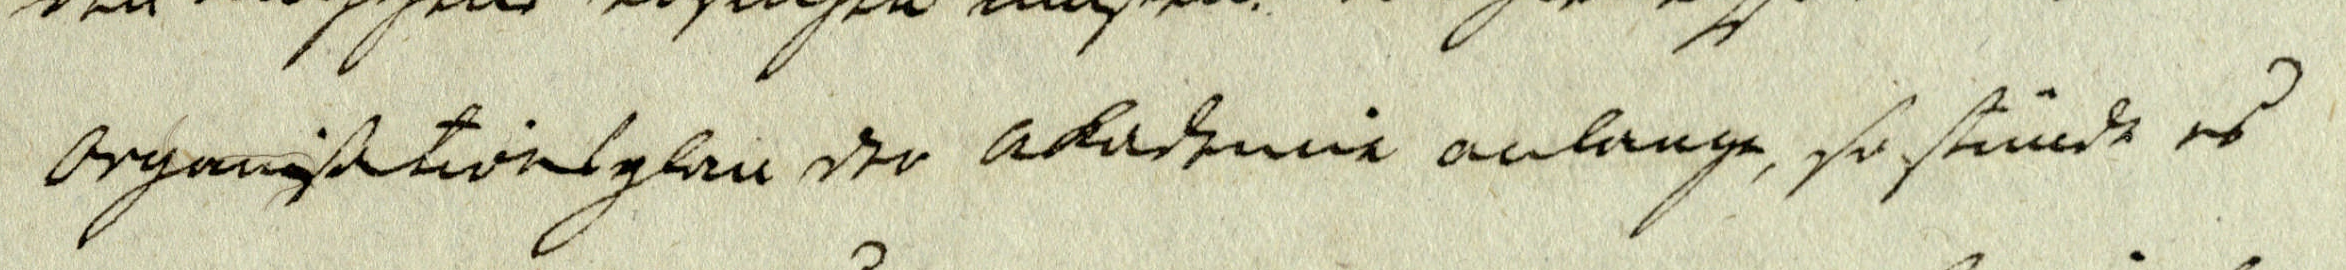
Organisationsplan der Akademie anlange, so stünde es
